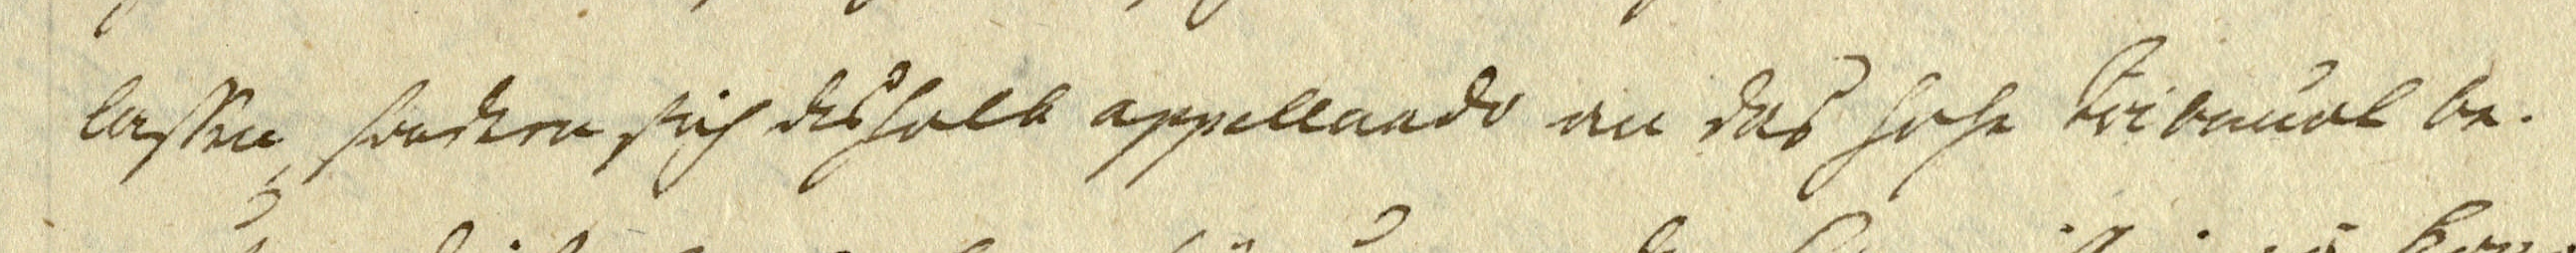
lassen, sondern sich deshalb appelando an des hohe Tribunal be¬
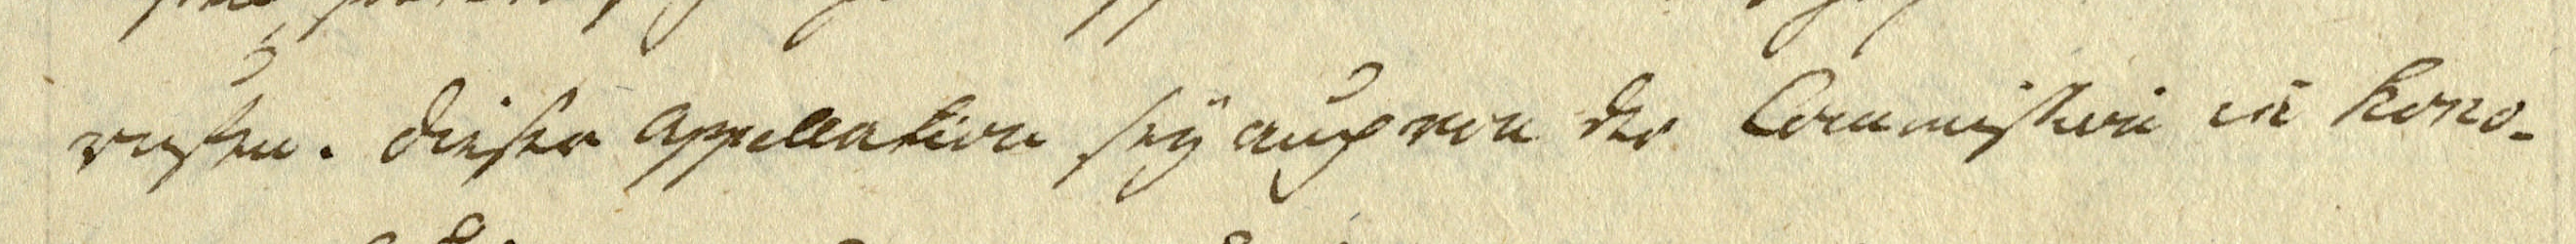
rufen. Dieser Appellation seÿ auch von der Commission in hono¬
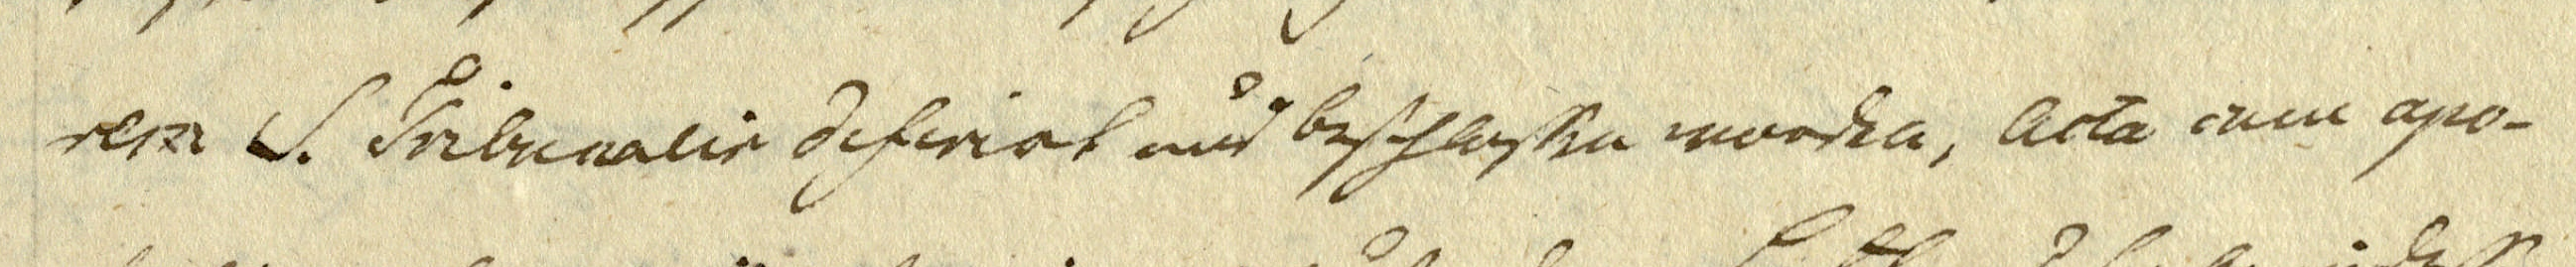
rem S. Tribunalie deferirt und beschlossen worden, Acta cum apo¬
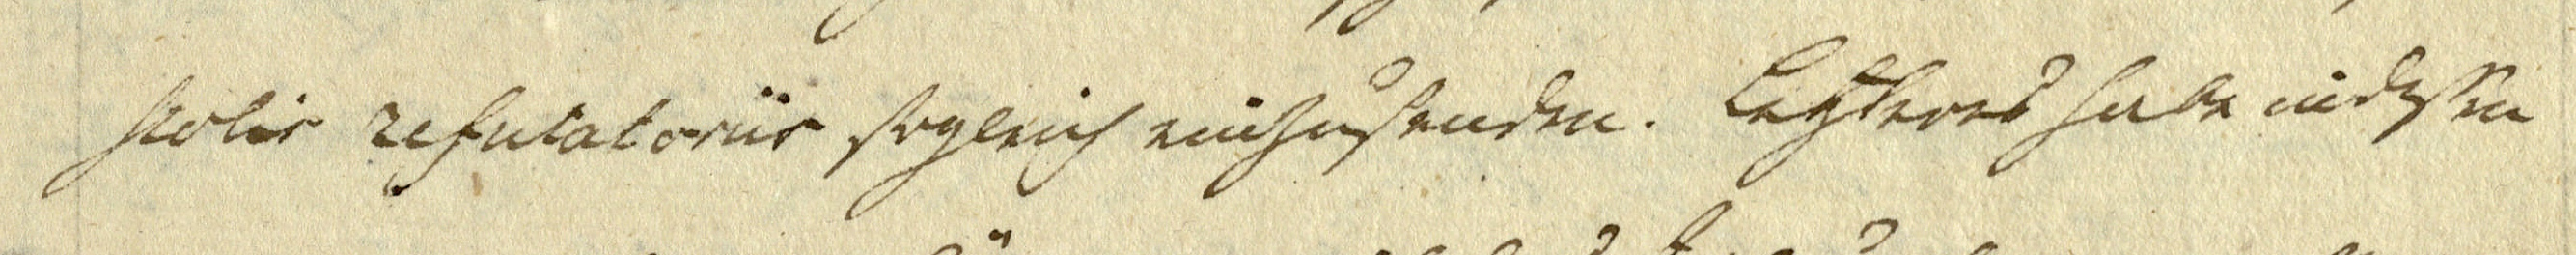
stolis refutatoriis sogleich einzusenden. Letzteres habe indessen
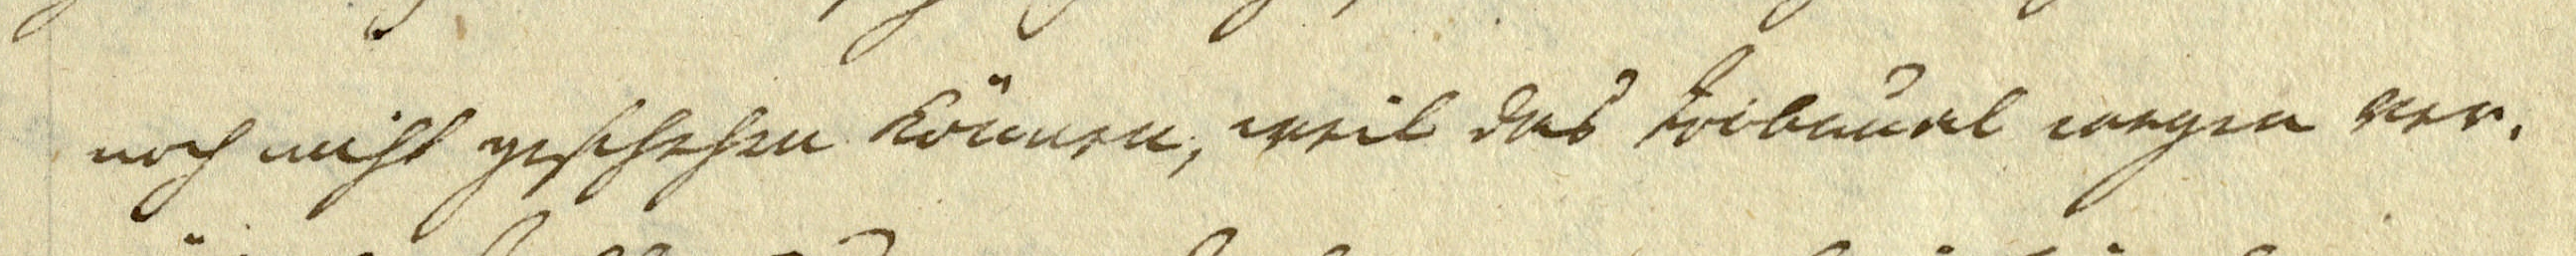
noch nicht geschehen können, weil das Tribunal wegen ver¬
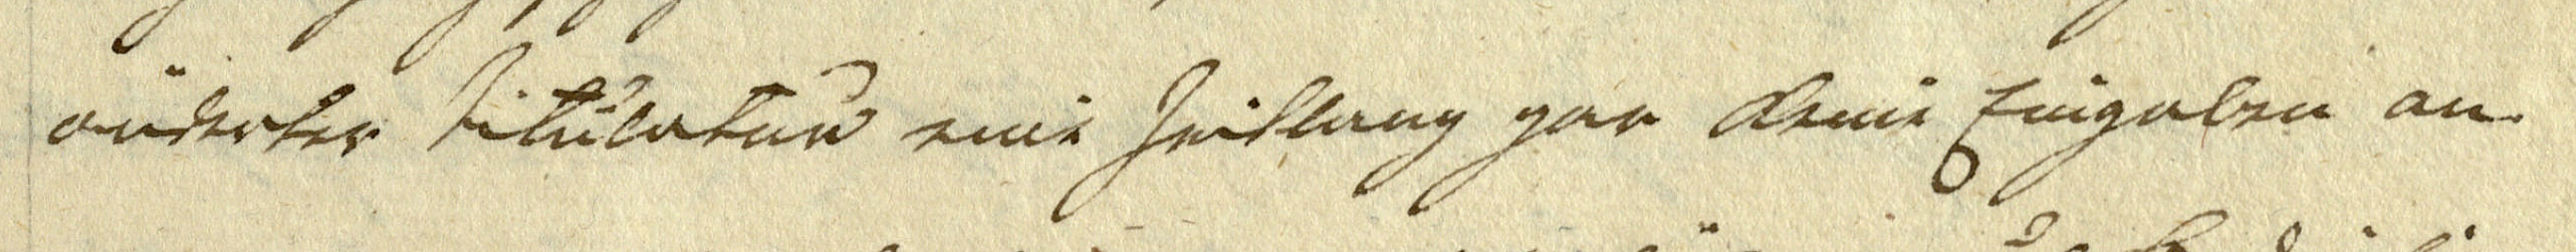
änderter Titulatur eine Zeitlang gar keine Eingaben an¬
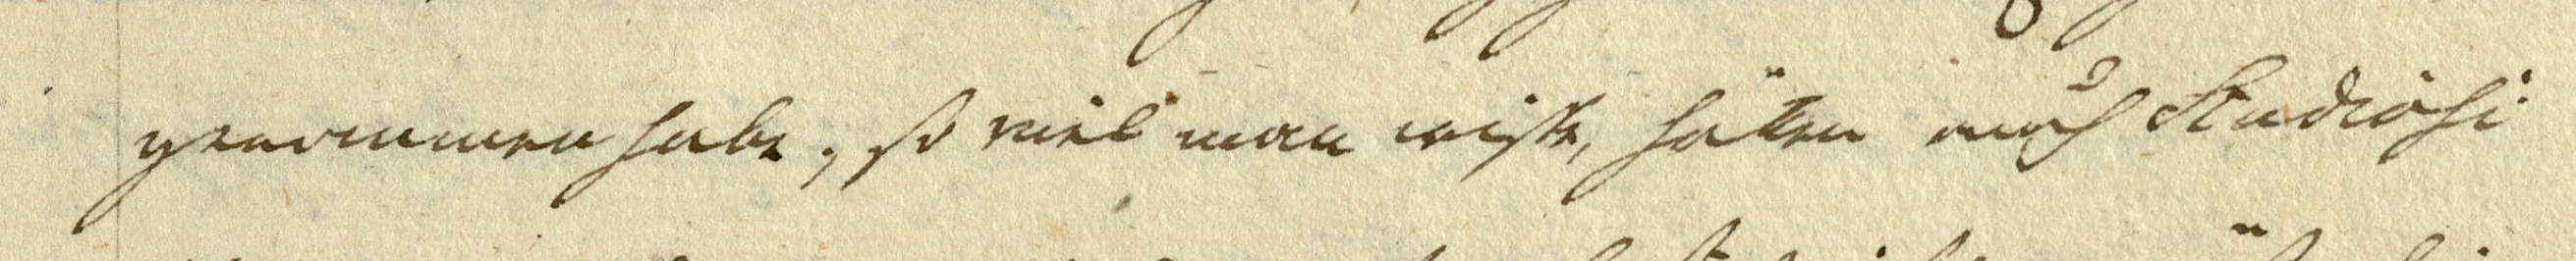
genommen habe, so viel man wisse, haben auch Studiosi
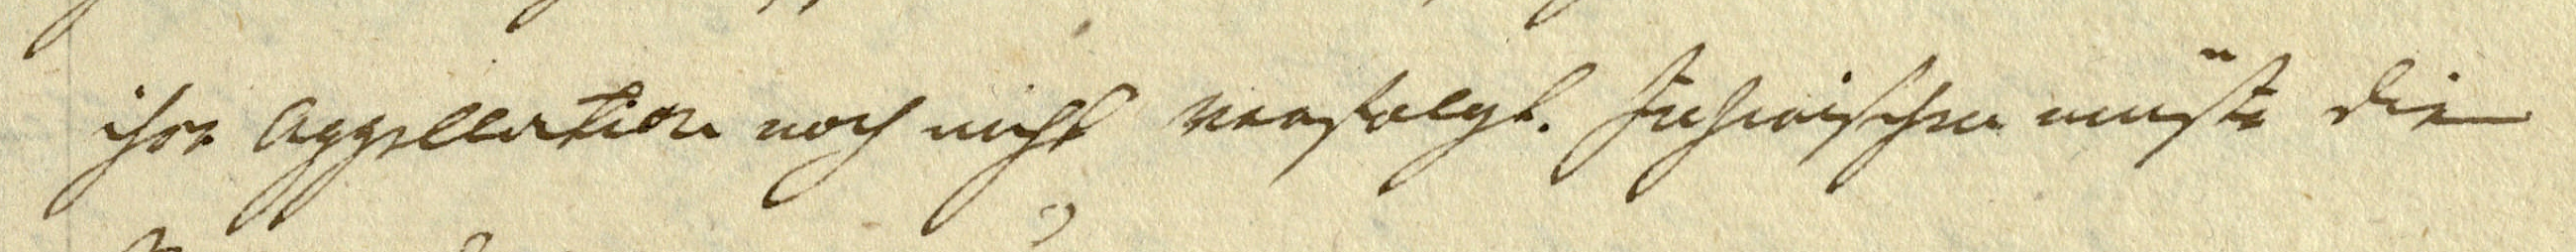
ihre Appellation noch nicht verfolgt. Inzwischen müßte die
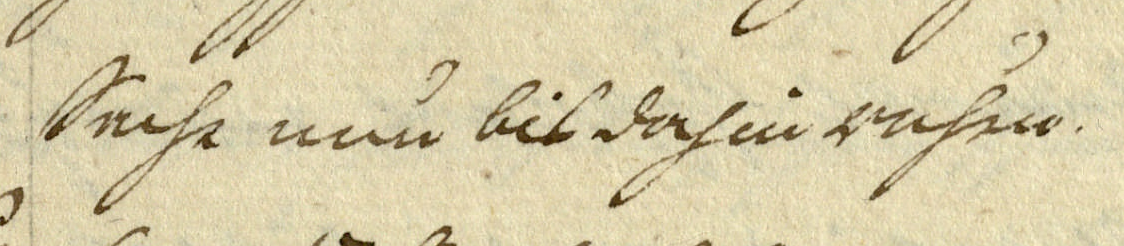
Sache nun bis dahin ruhen.
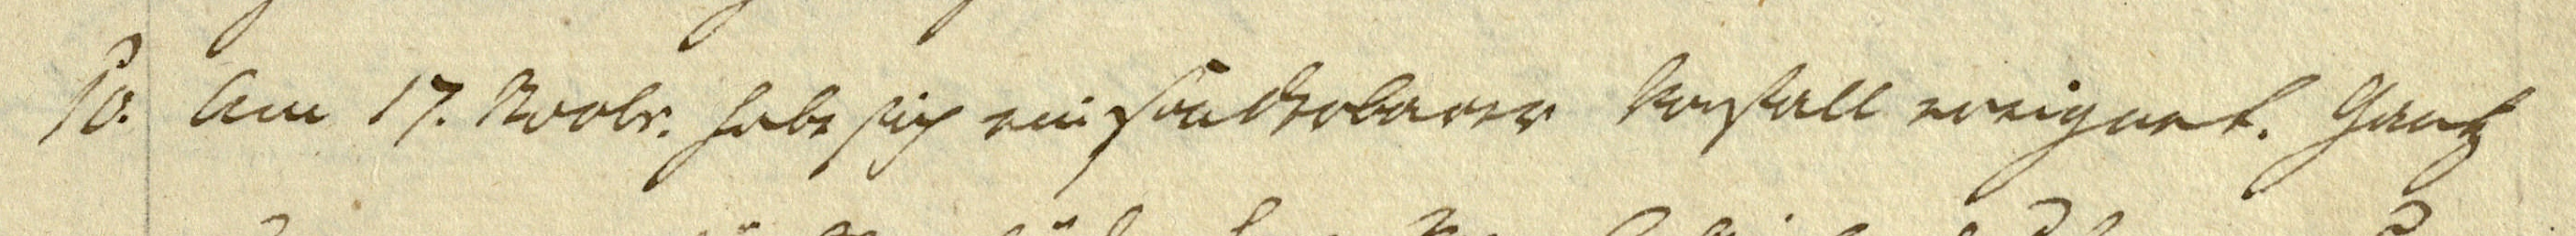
10. Am 17. Novbr. habe sich ein sonderbarer Vorfall ereignet. Gantz
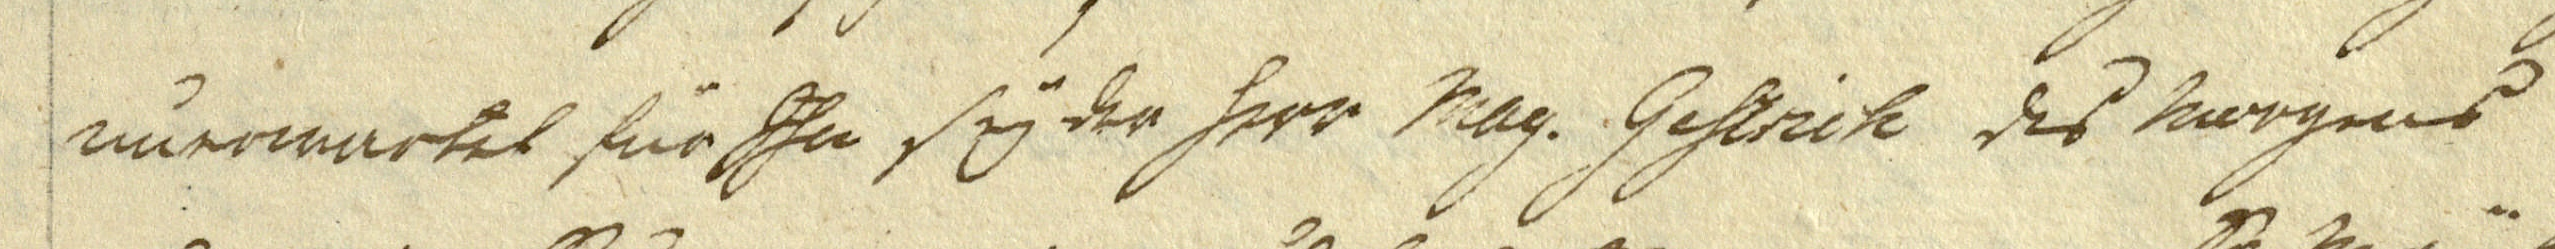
unerwartet für Ihn seÿ der Herr Mag. Gestrich des Morgens
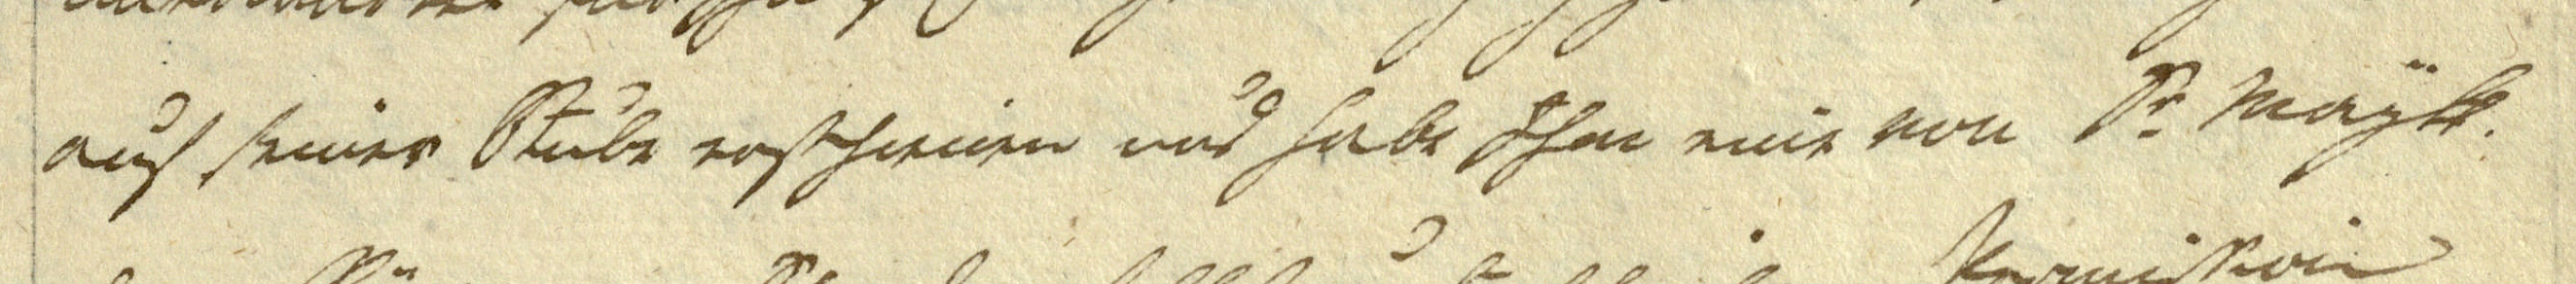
auf seiner Stube erschienen und habe Ihm eine von Sr Maÿtt.
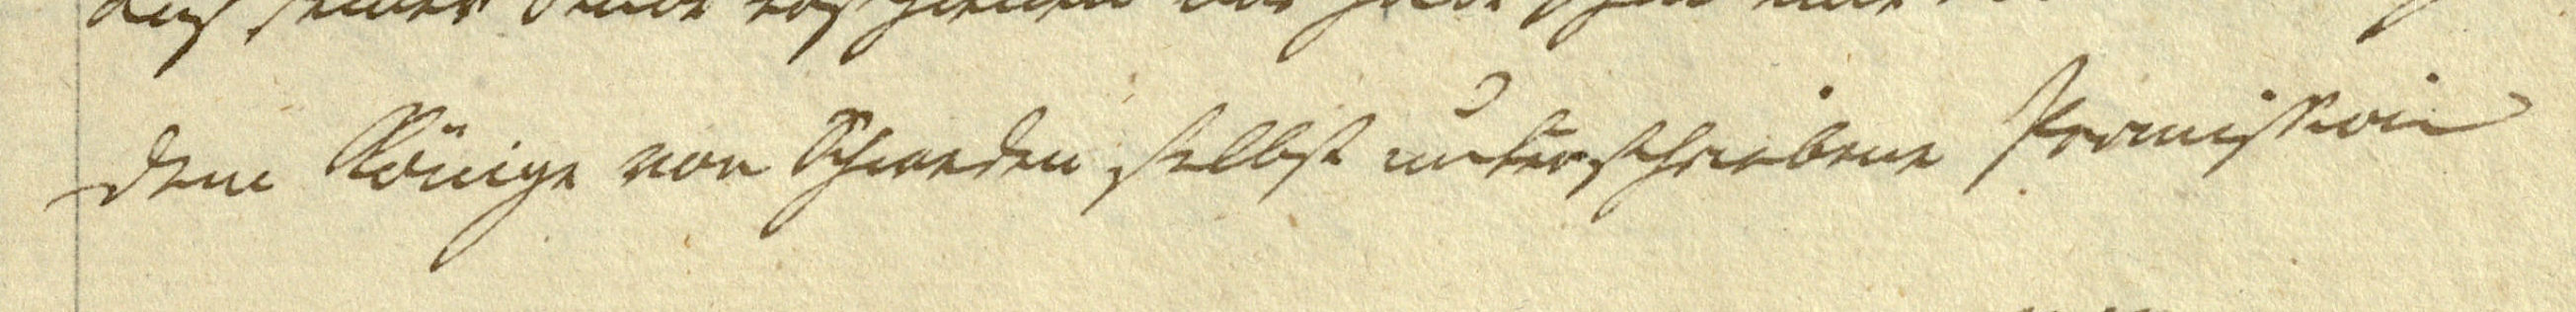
dem Könige von Schweden selbst unterschriebene Permission
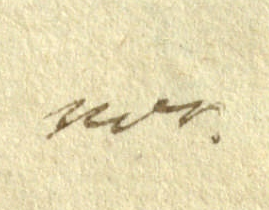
vor
